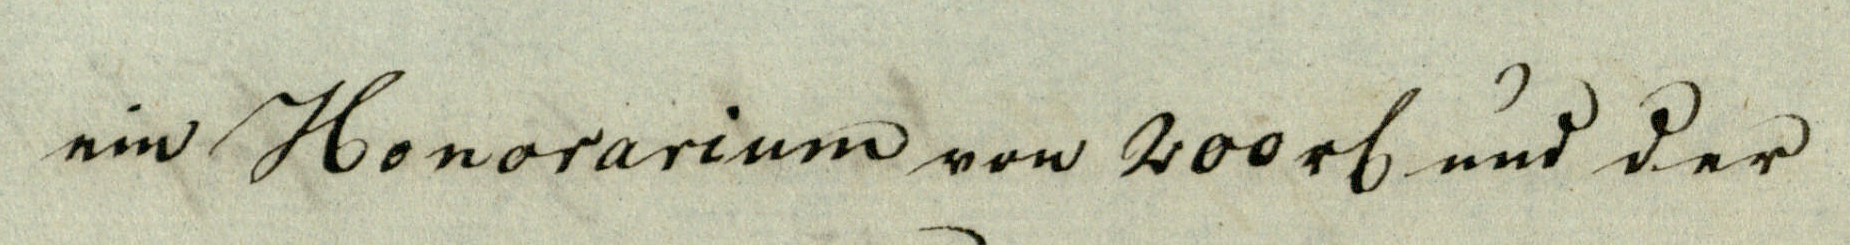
ein Honorarium von 200 rl und der
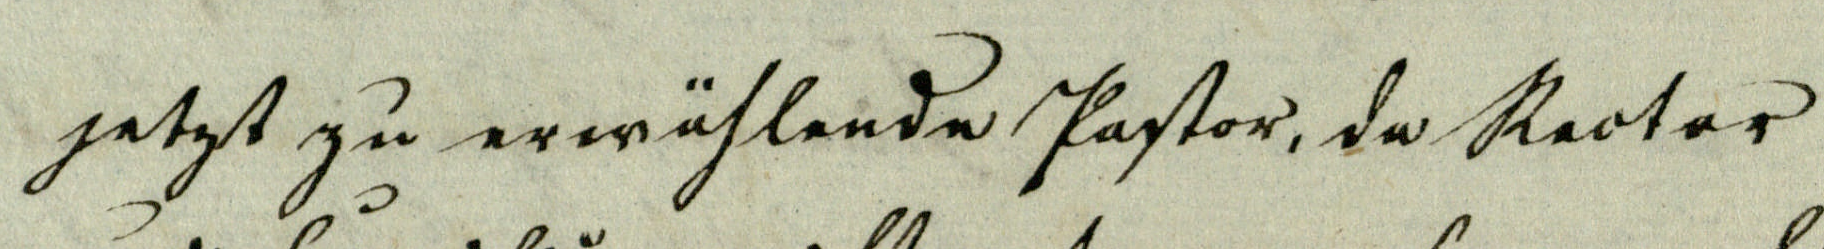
jetzt zu erwählende Pastor, da Rector
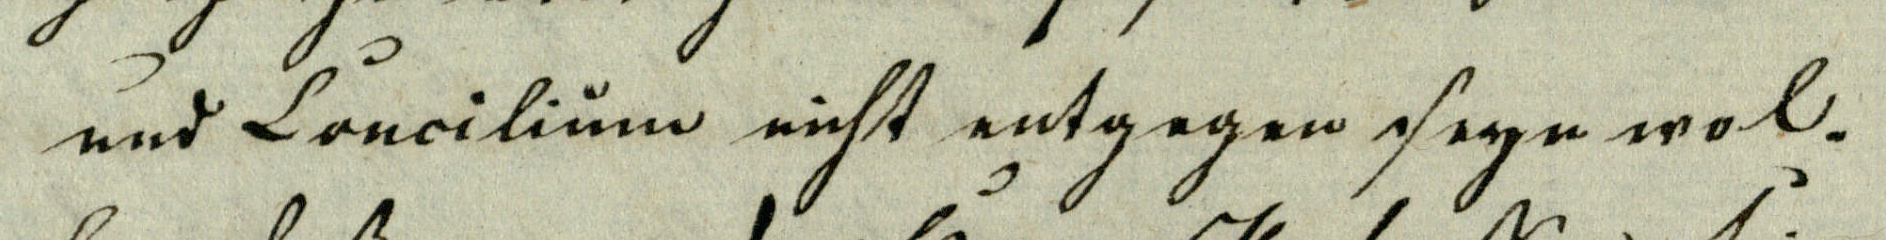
und Concilium nicht entgegen seyn wol¬
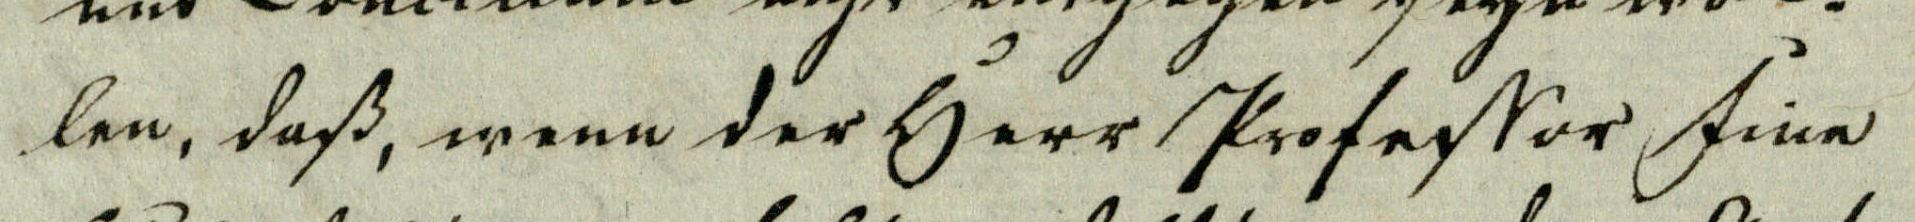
len, daß, wenn der Herr Professor Fin¬
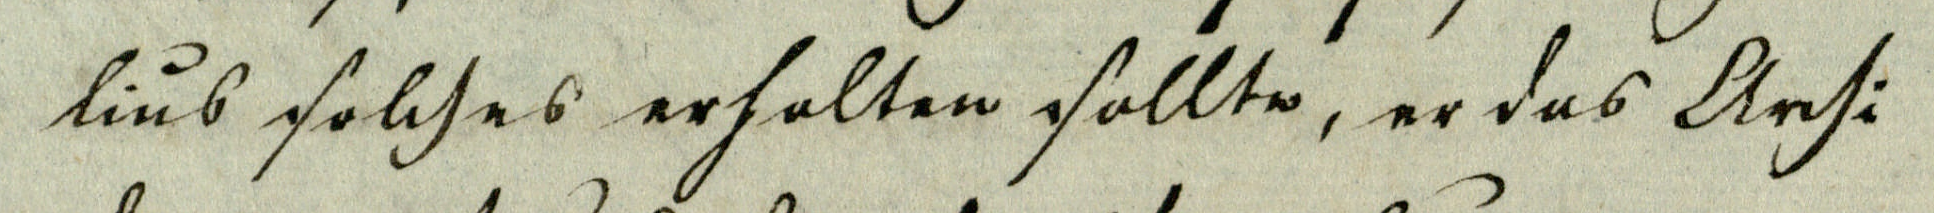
lius solches erhalten sollte, er das Archi¬
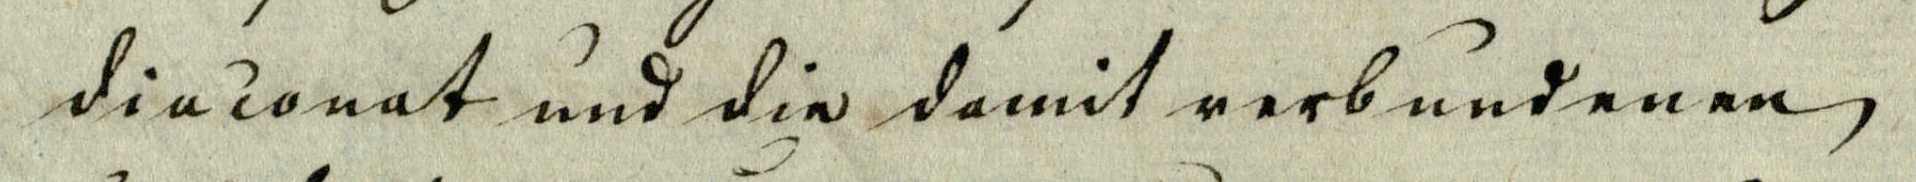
diaconat und die damit verbundenen
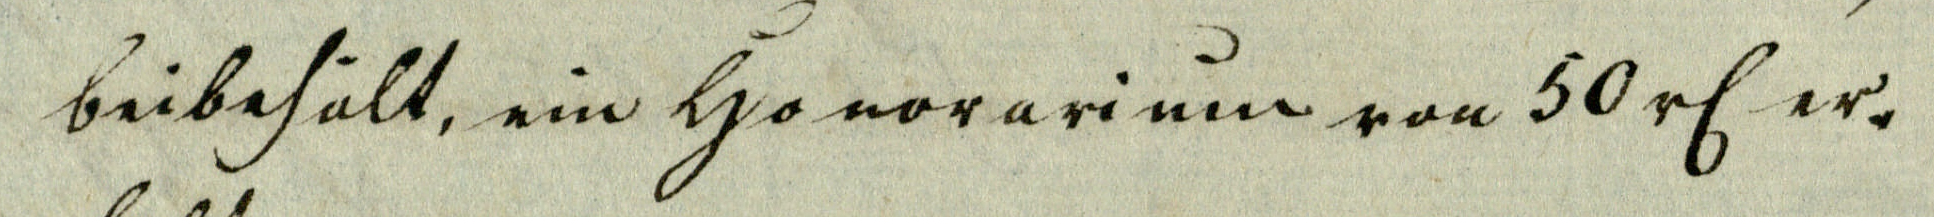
beibehält, ein Honorarium von 50 rl er¬
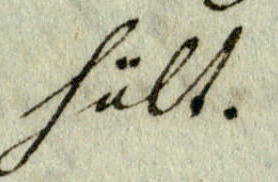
hält.
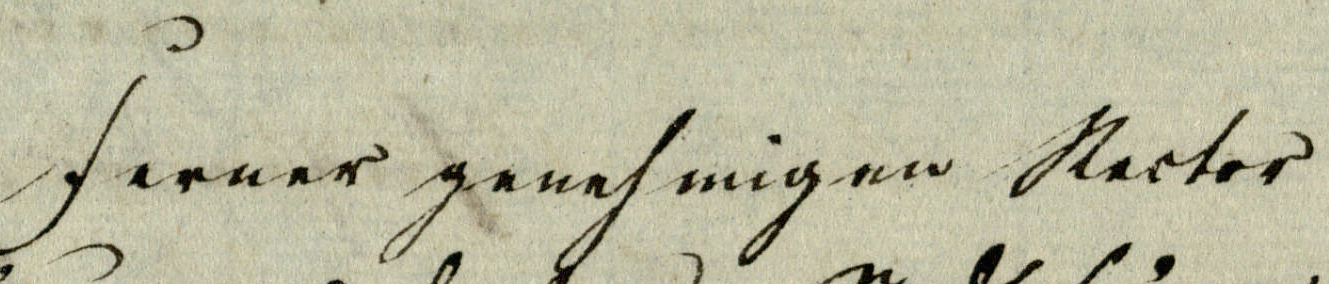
Ferner genehmigen Rector
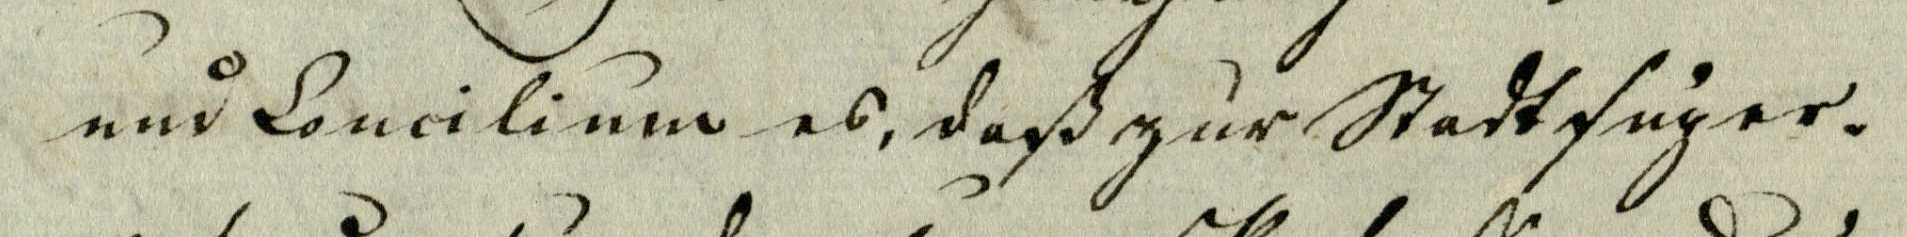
und Concilium es, daß zur Stadt super¬
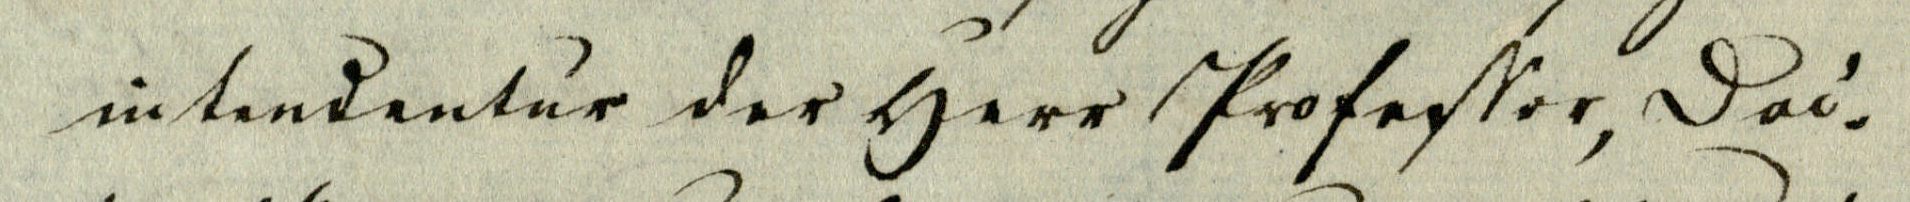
intendentur der Herr Professor, Doc¬
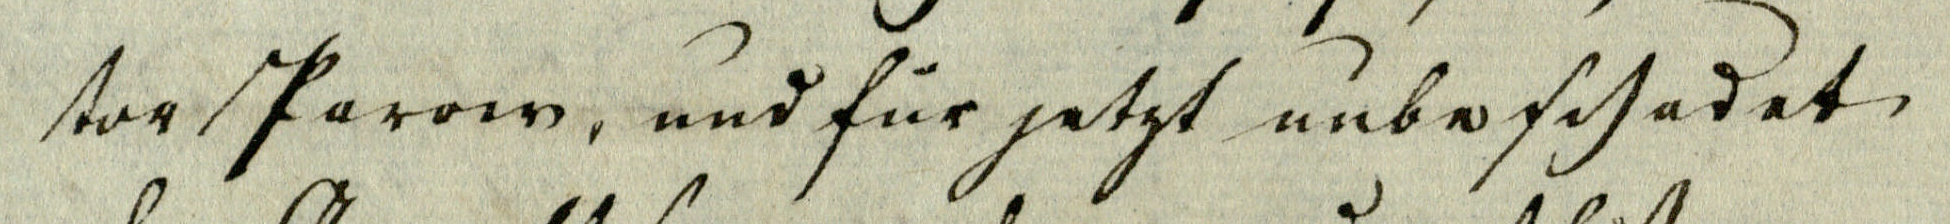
tor Parow, und für jetzt unbeschadet
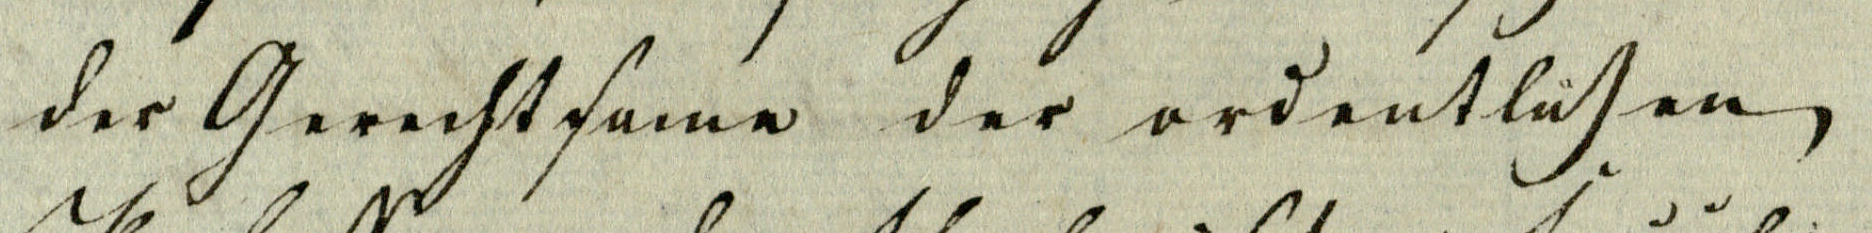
der Gerechtsame der ordentlichen
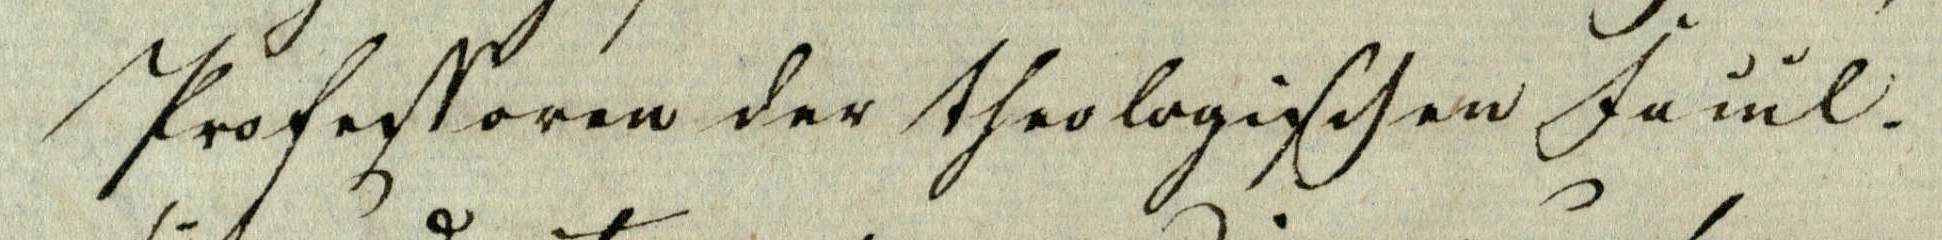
Professoren der theologischen Facul¬
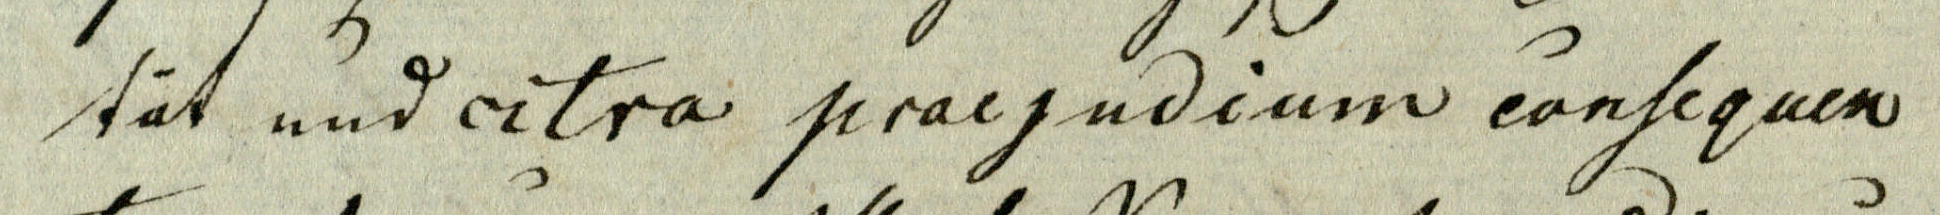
tät und citra prae judium consequen¬
